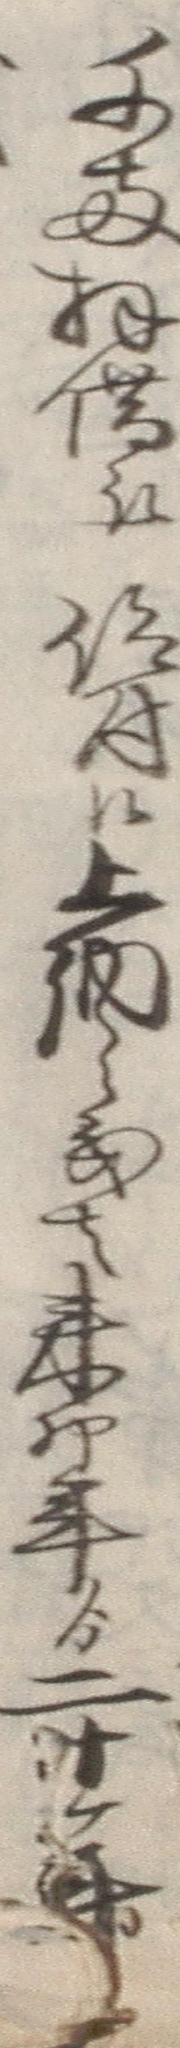千両拝借被仰付候上納之義者来卯年ゟ二十ケ年
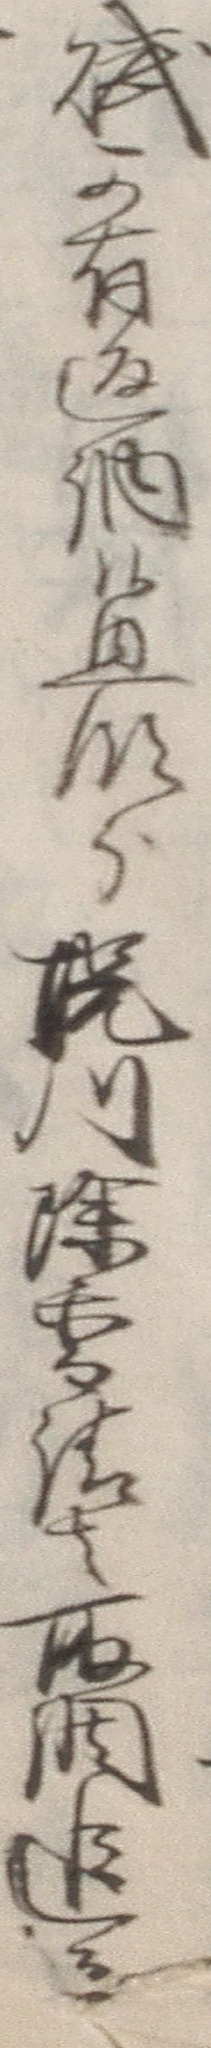賦可有返納候且領分堤川除普請者取調追而
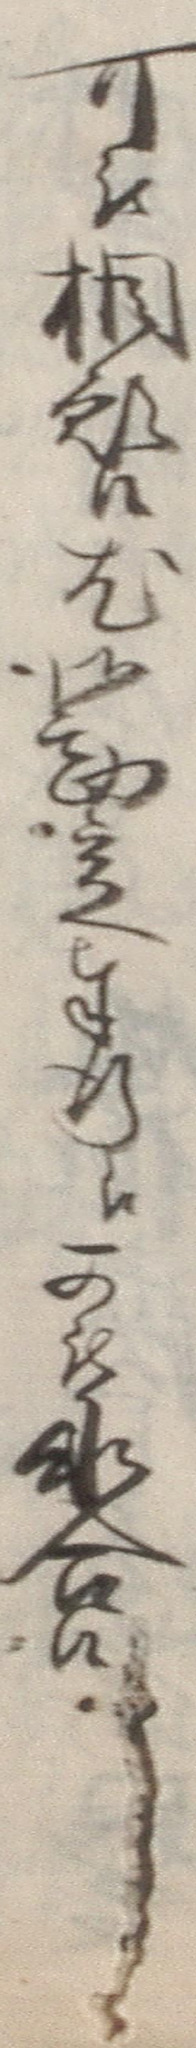可被相願候尤御勘定奉行江可被承合候
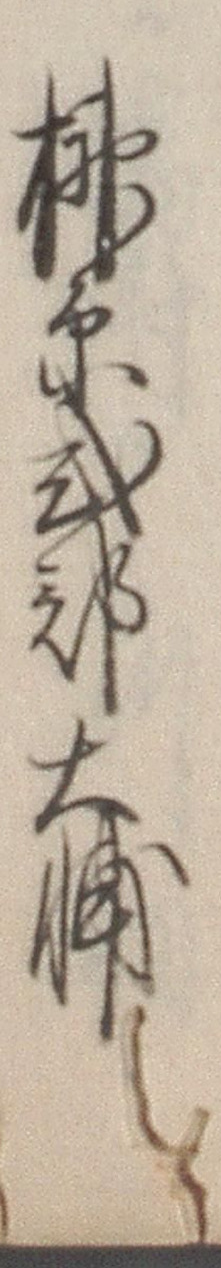榊原式部大輔
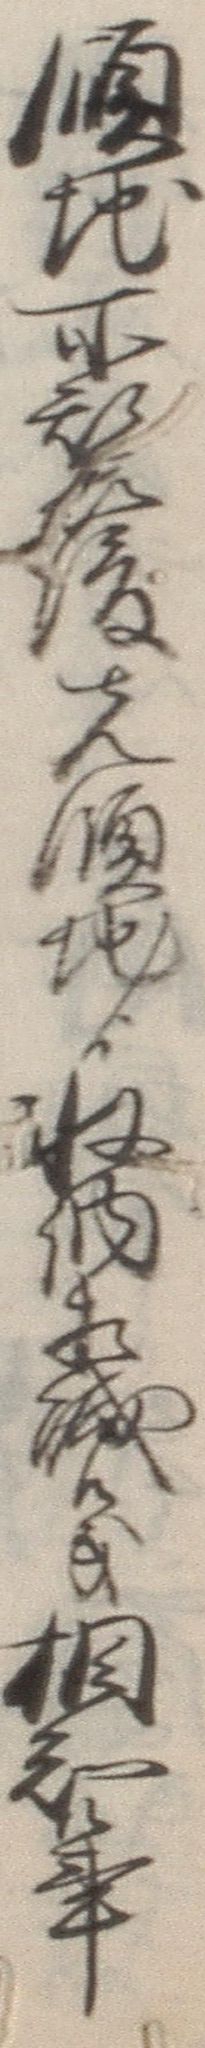領地所替以後先領地ゟ収納相減候義相知候事
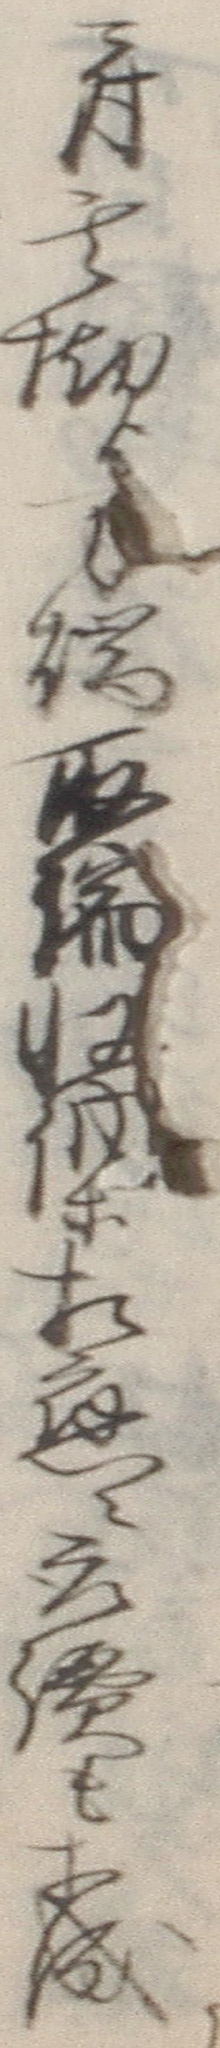ニ付其砌ゟ万端取縮収納等相応二取続も相成
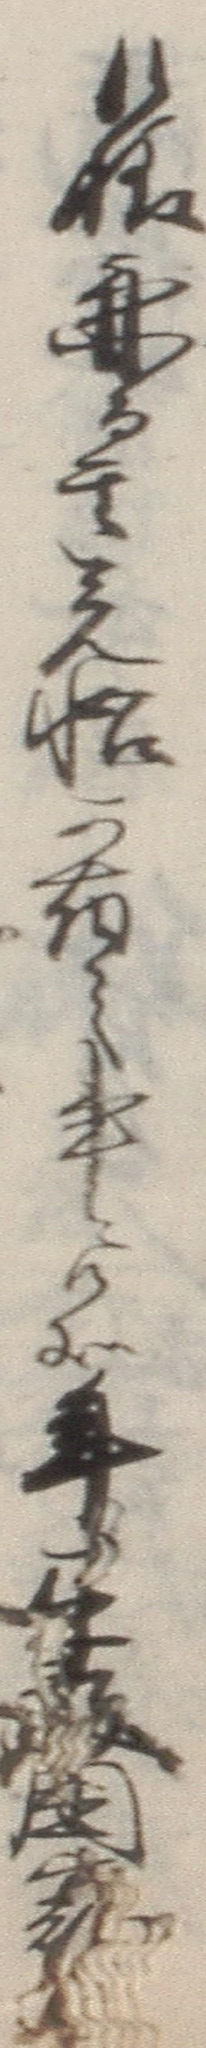候様兼而其覚悟可有之事ニ候処年々半減困窮
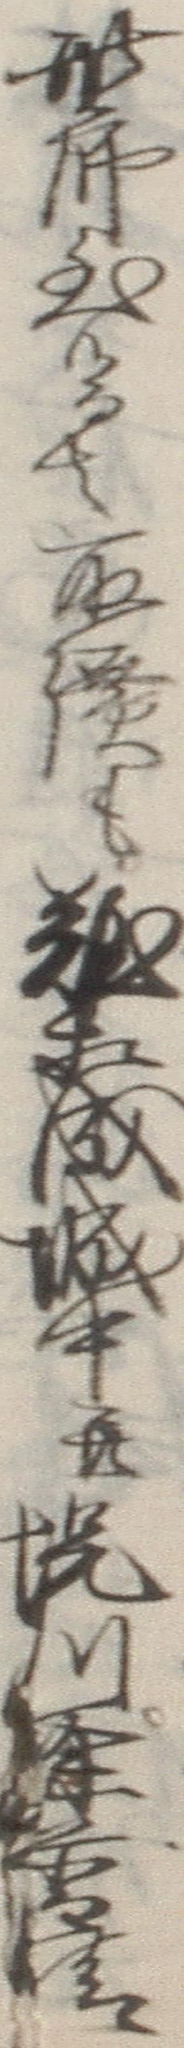此節至候而は取続も難相成城中幷堤川除普請
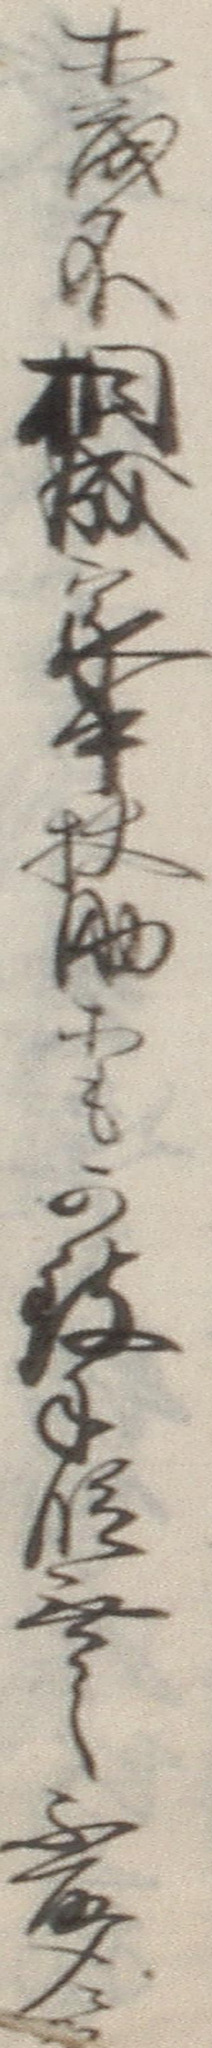等茂不相成家中扶助等も可致手段無之不取〆ニ而
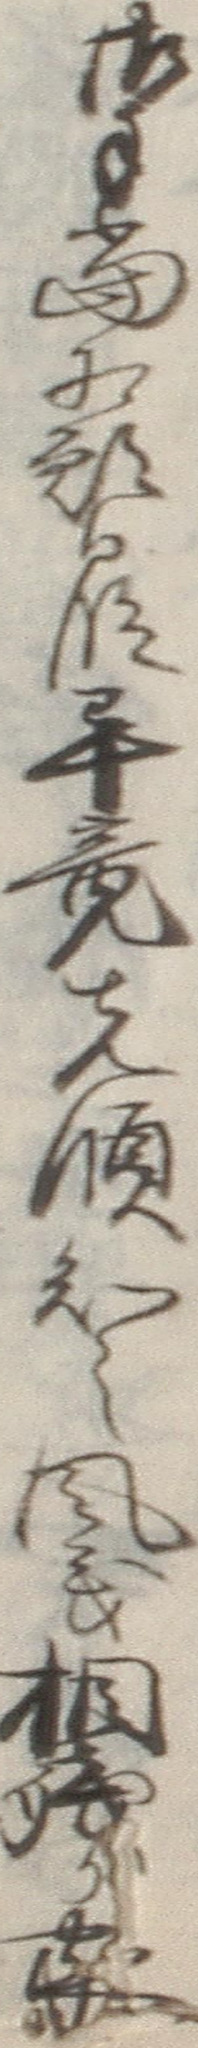御手当相願候段畢竟先領知之風義相残分家
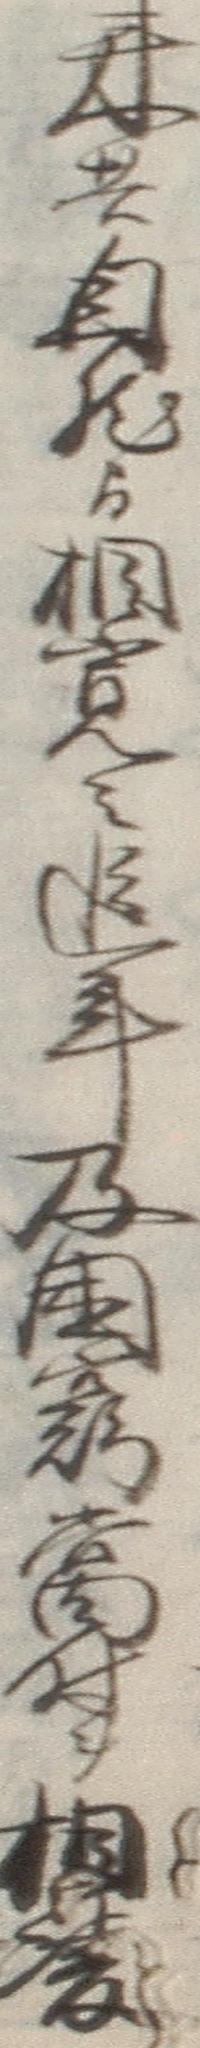来共自然与相寛之追年及困窮当時ヲ相凌
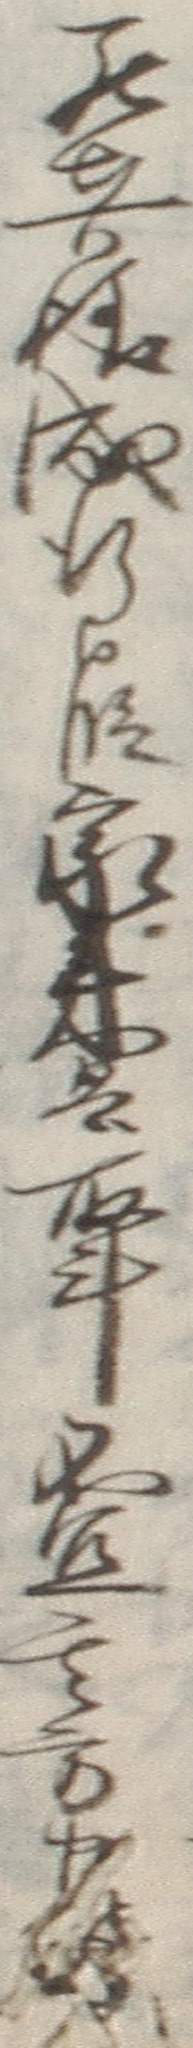罷在候様成行候段家来共取斗不宜其方申付
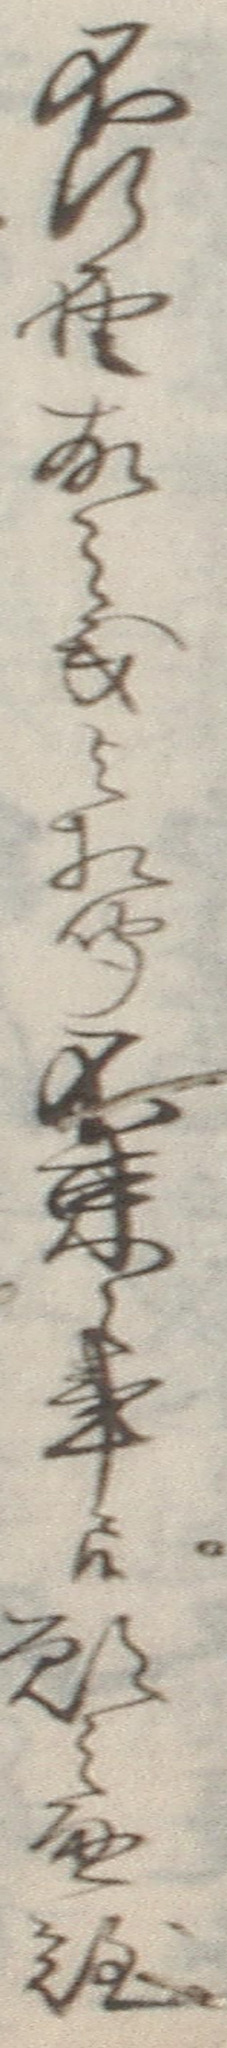不行届故之義与相聞不束之事ニ候願之通難
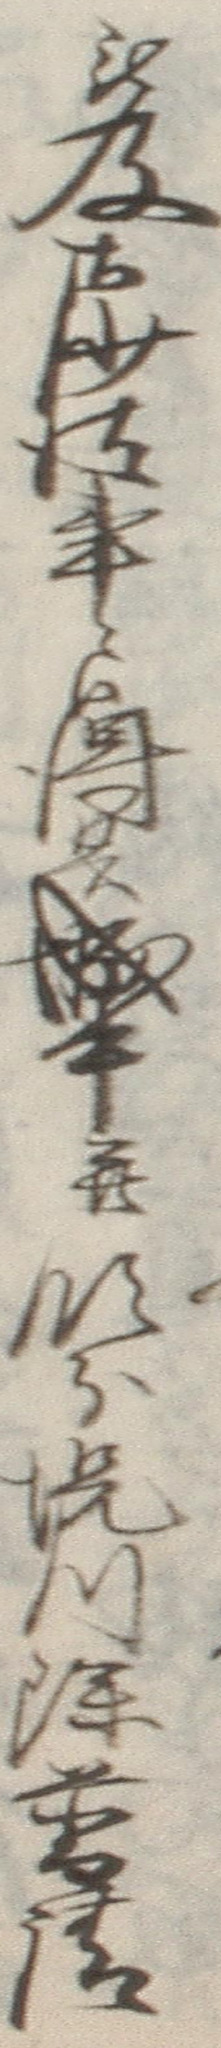被及御沙汰事ニ候得共城中幷領分堤川除普請
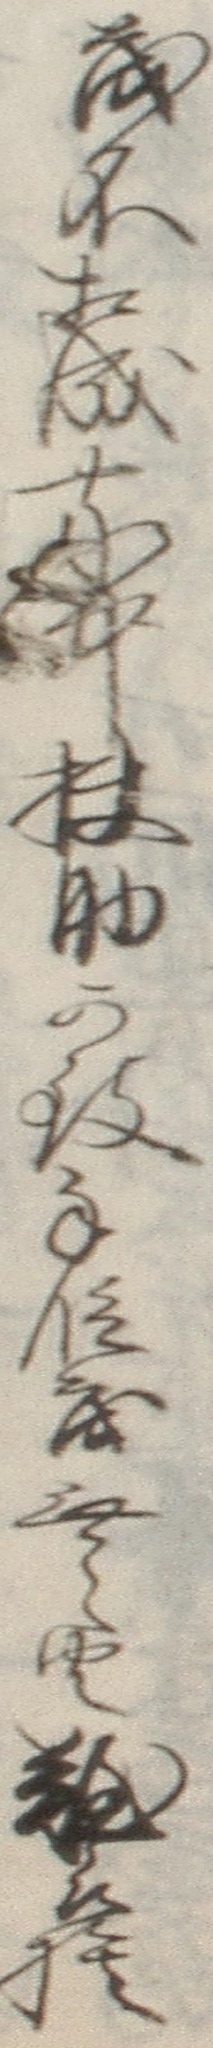茂不相成家中扶助可致手段茂無之由難被捨
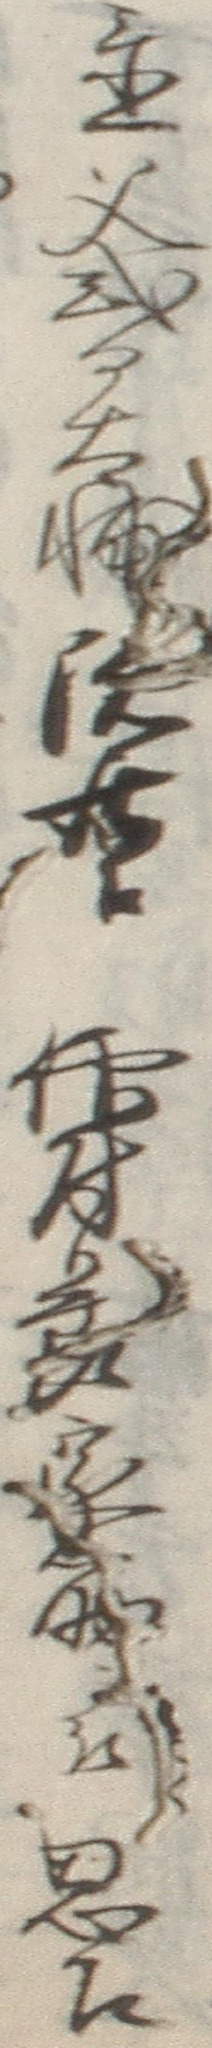置父弐部太輔隠居被仰付候節家筋被思召
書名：[諸国災害記録]
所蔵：東京大学地震研究所図書室 Earthquake Research Institute Library, The University of Tokyo, JAPAN
